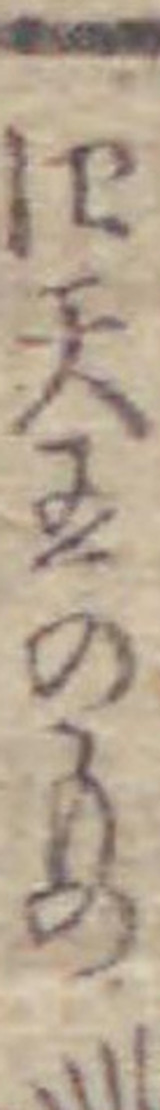四天王のもの
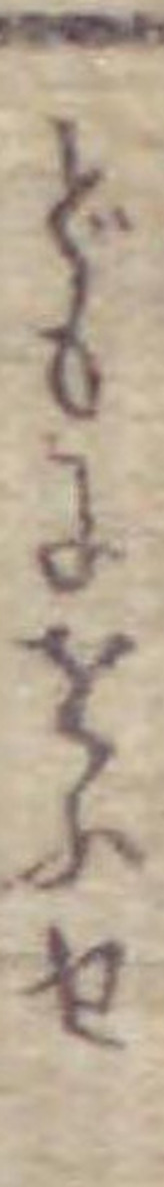どもにをふせ
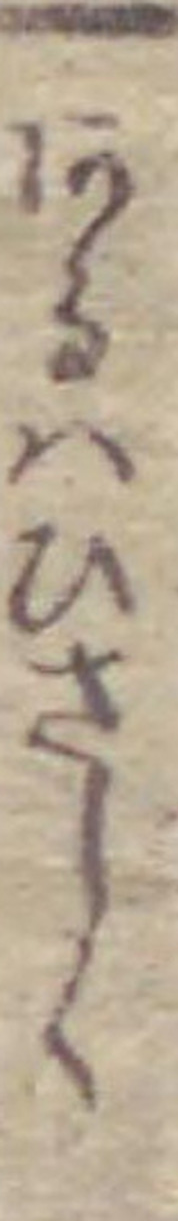あるはひさしく
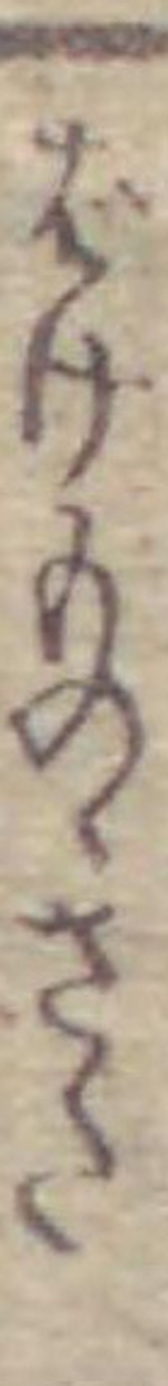ばけものゝさた
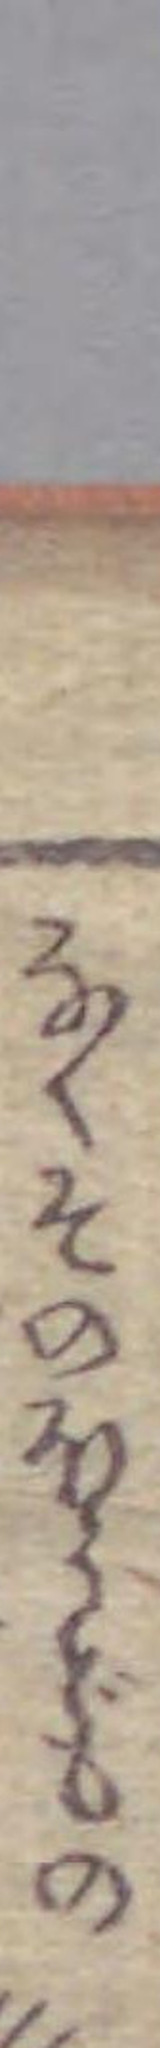なくそのほうどもの
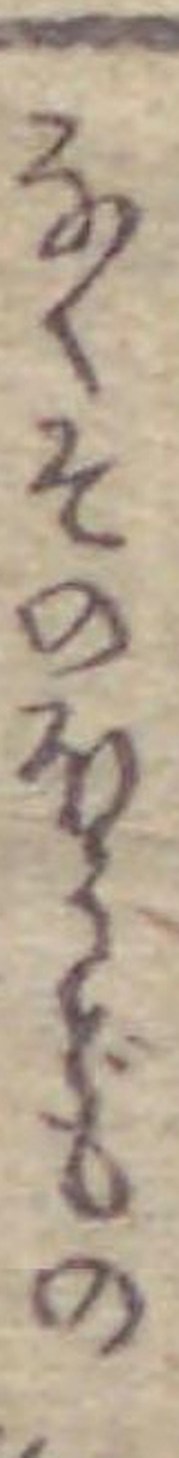なくそのほうどもの
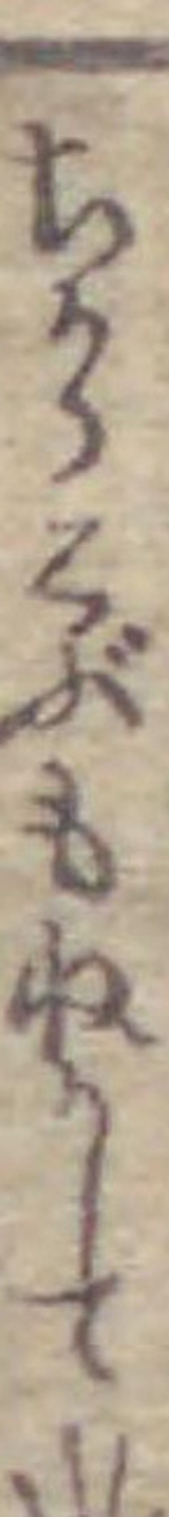ちからこぶもねかして
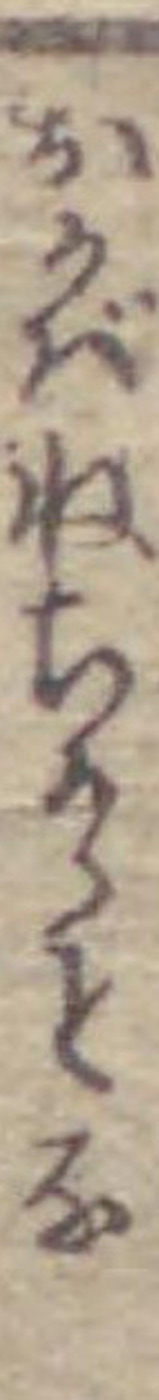おかばねちからとな
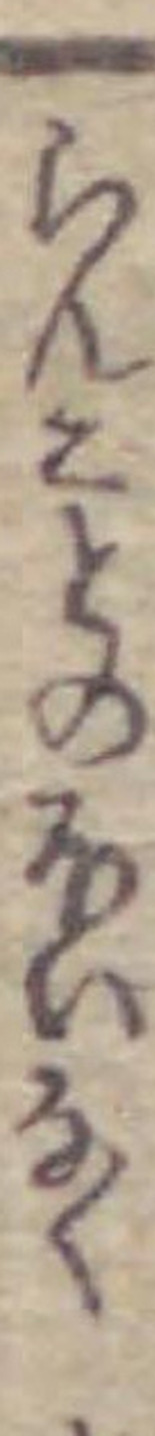らんことのほいなく
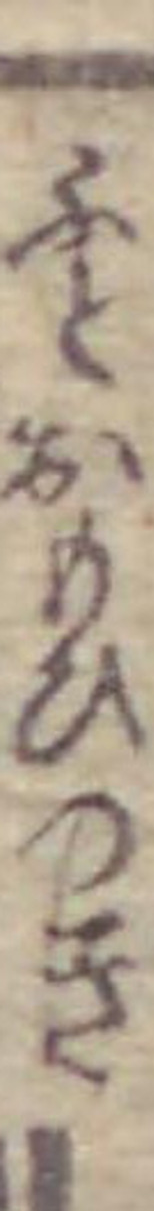ふとおもひつき
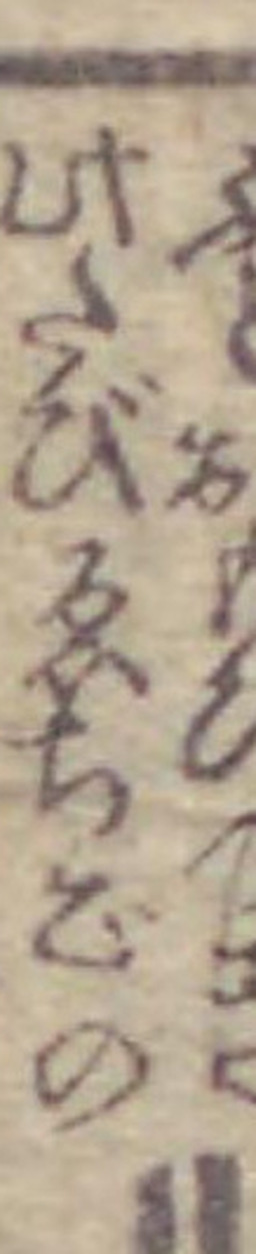此たびゑちごの
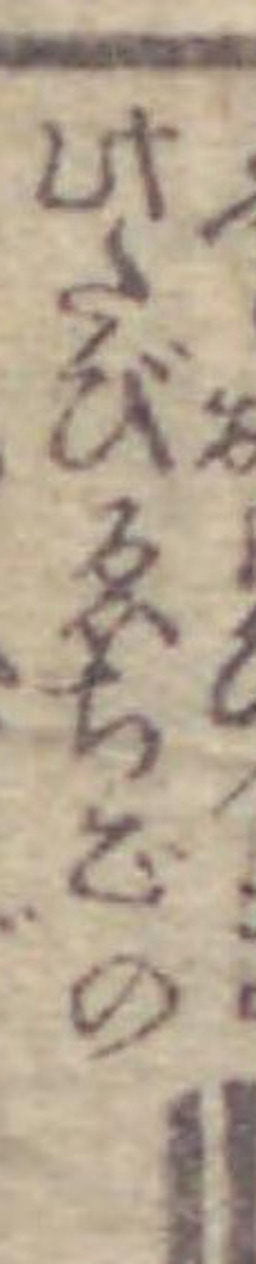此たびゑちごの
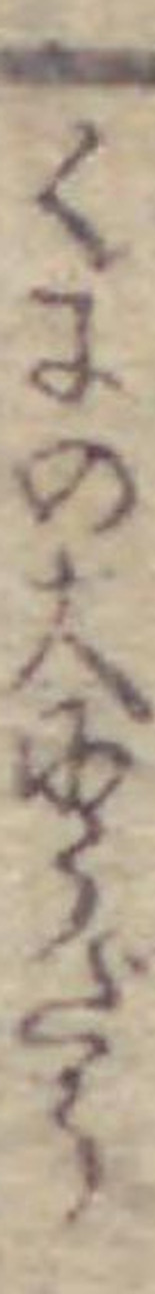くにの大にうだう
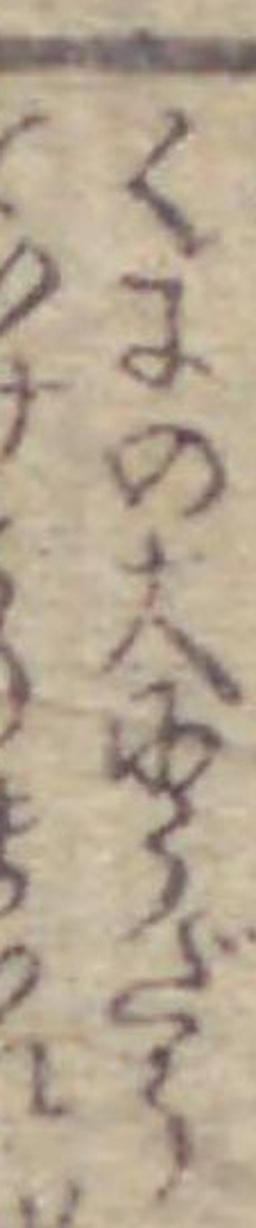をいけとりまいれ
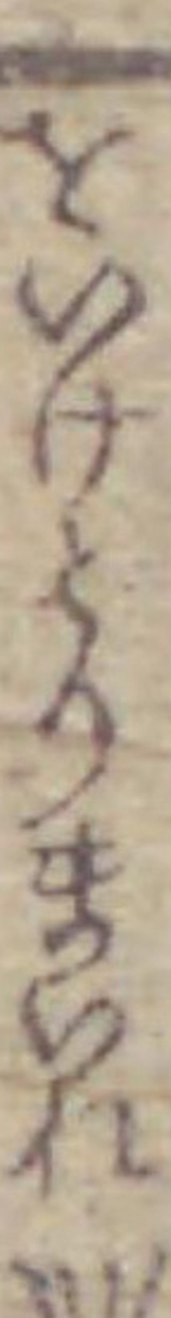をいけとりまいれ
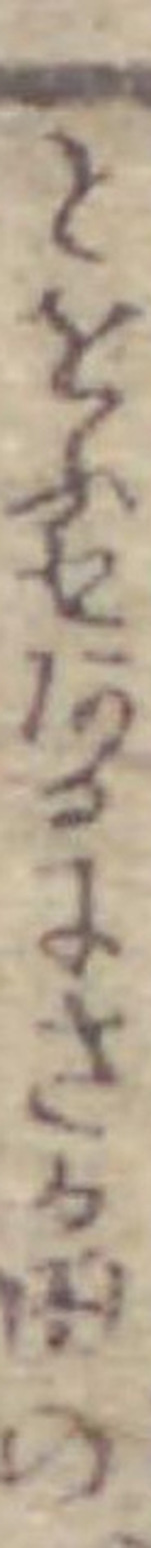とをふせあるにさか田の
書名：二日替 : 2巻
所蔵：国立国会図書館 National Diet Library, JAPAN
